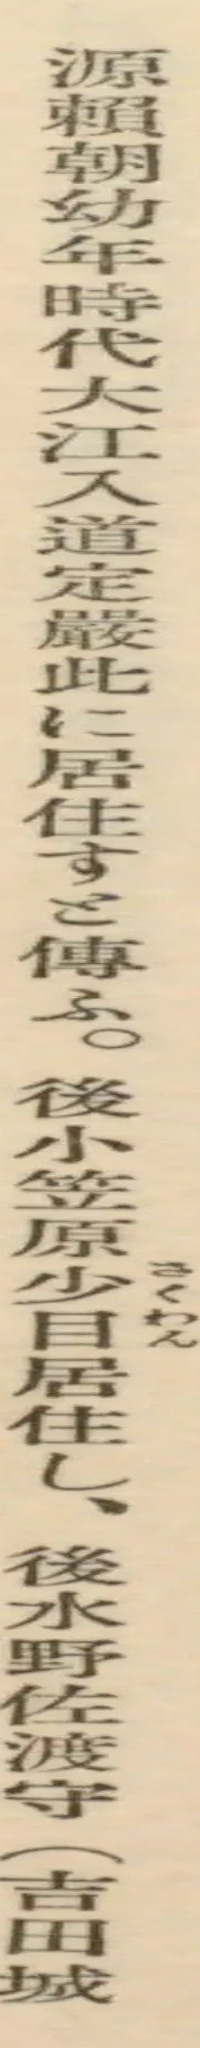源頼朝幼年時代大江入道定厳此に居住すと伝ふ。後小笠原少目居住し、後水野佐渡守(吉田城
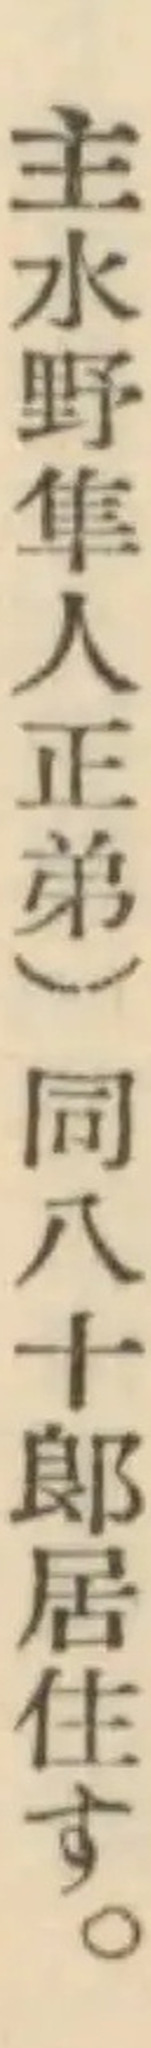主水野隼人正弟)同八十郎居住す。
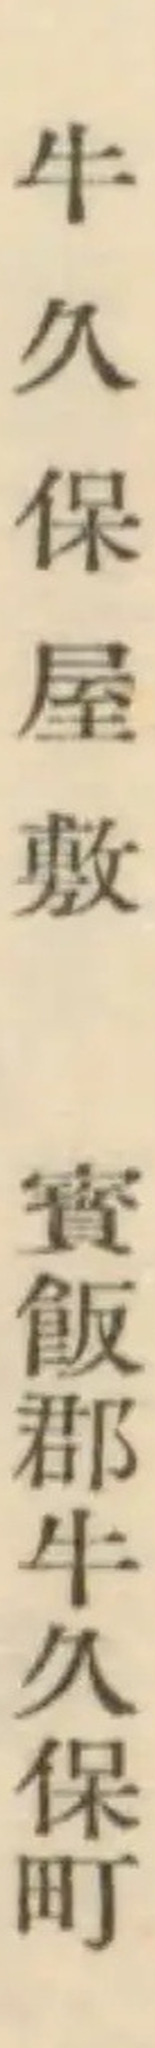牛久保屋敷宝飯郡牛久保町
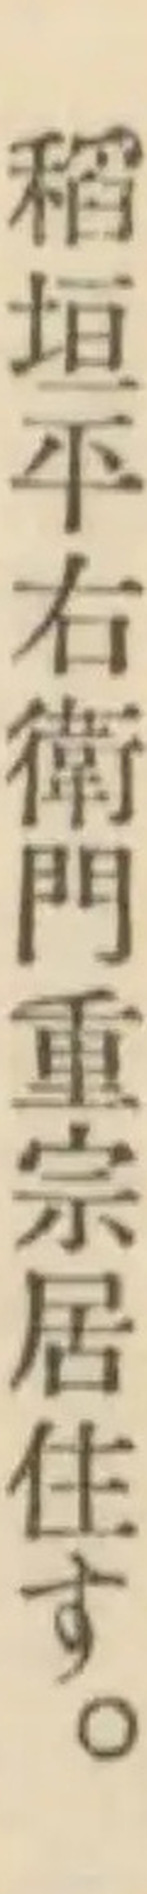稲垣平右衛門重宗居住す。
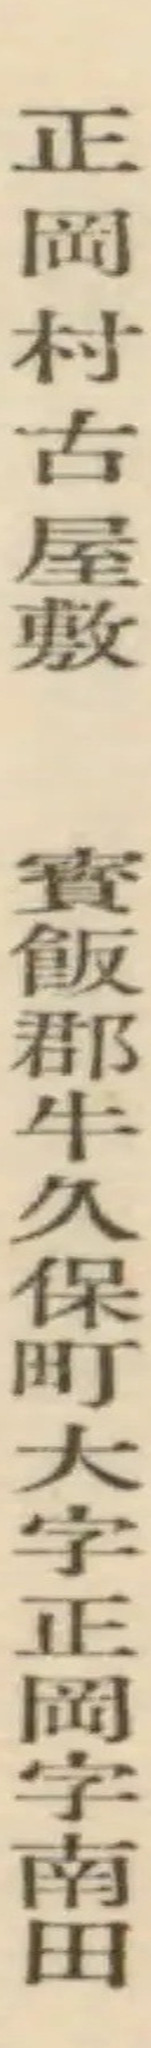正岡村古屋敷宝飯郡牛久保町大字正岡字南田
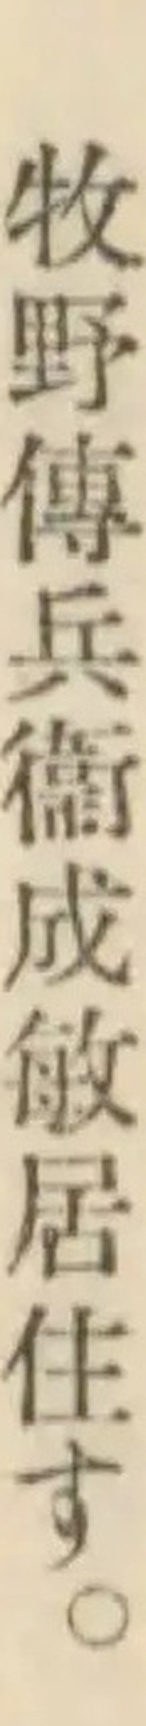牧野伝兵衛成敏居住す。
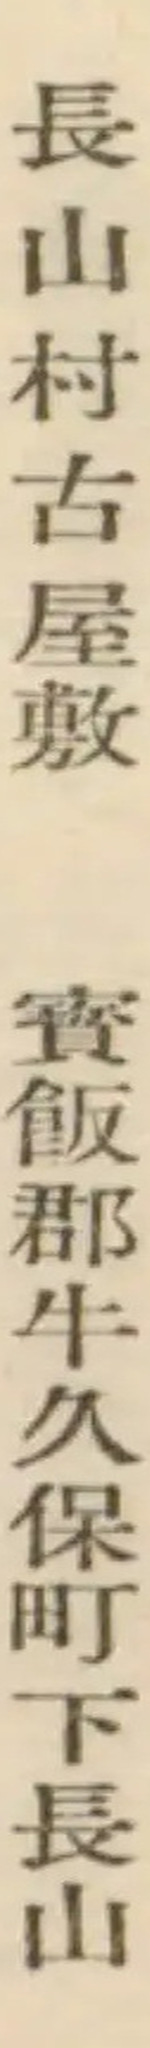長山村古屋敷宝飯郡牛久保町下長山
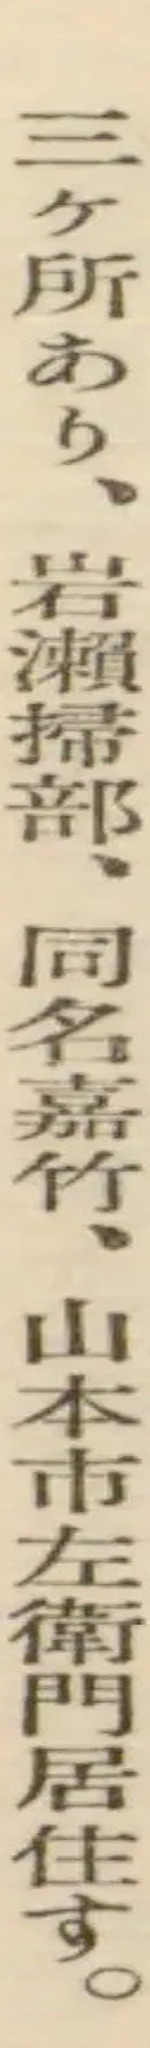三ヶ所あり、岩瀬掃部、同名嘉竹、山本市左衛門居住す。
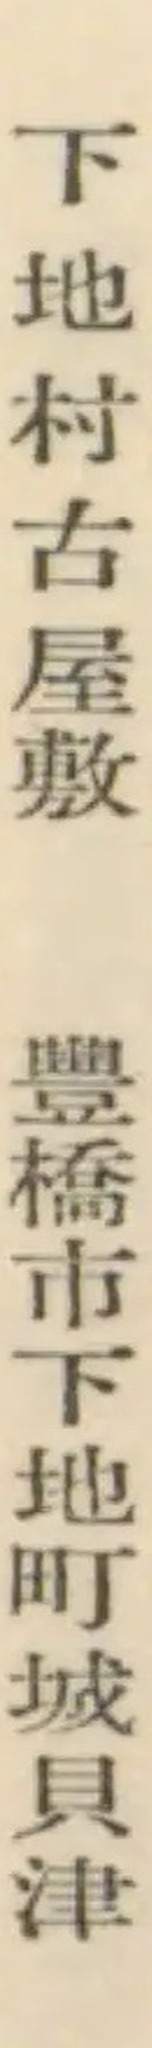下地村古屋敷豊橋市下地町城貝津
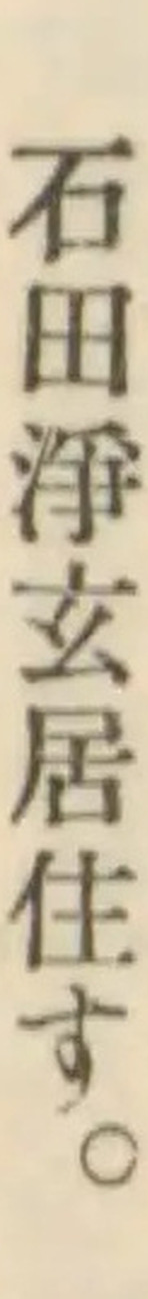石田浄玄居住す。
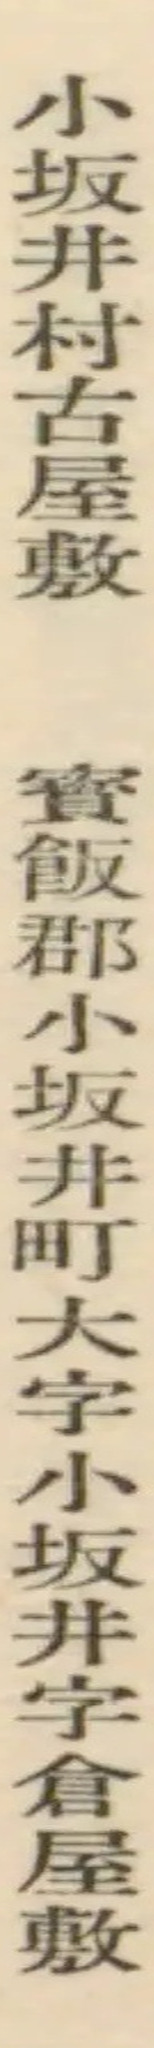小坂井村古屋敷宝飯郡小坂井町大字小坂井字倉屋敷
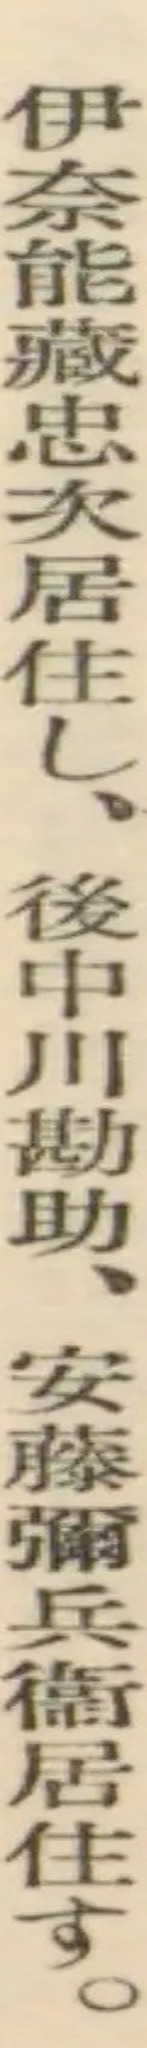伊奈能蔵忠次居住し、後中川勘助、安藤弥兵衛居住す。
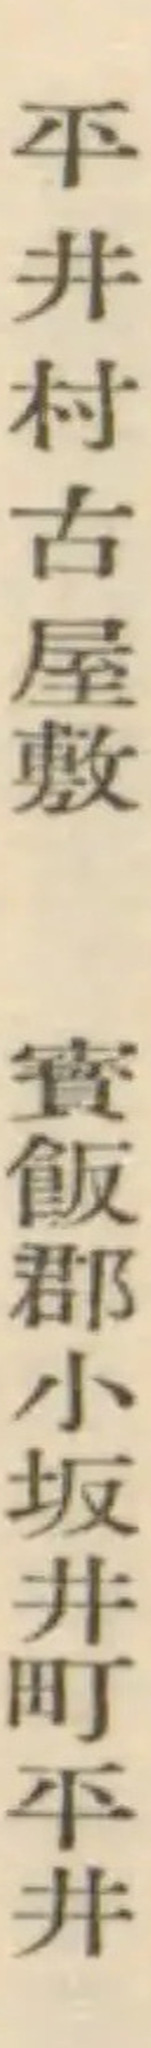平井村古屋敷宝飯郡小坂井町平井
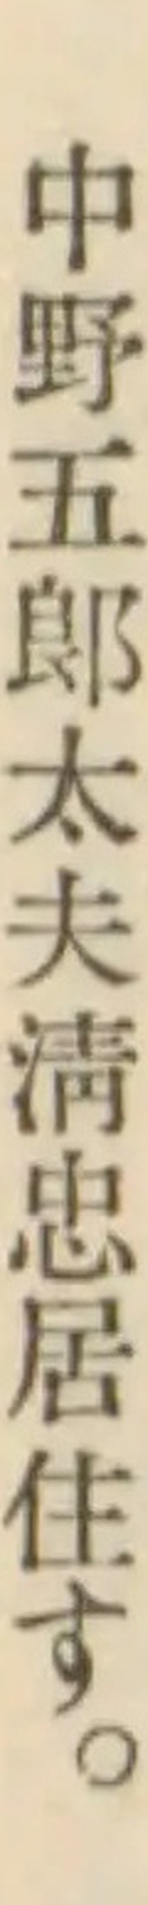中野五郎太夫清忠居住す。
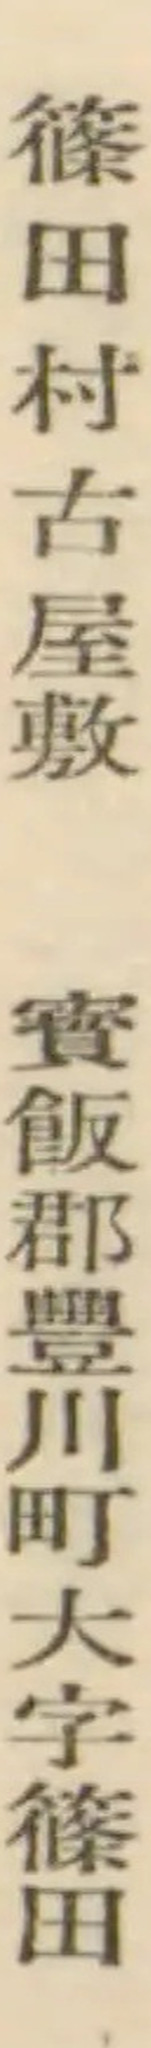篠田村古屋敷宝飯郡豊川町大字篠田

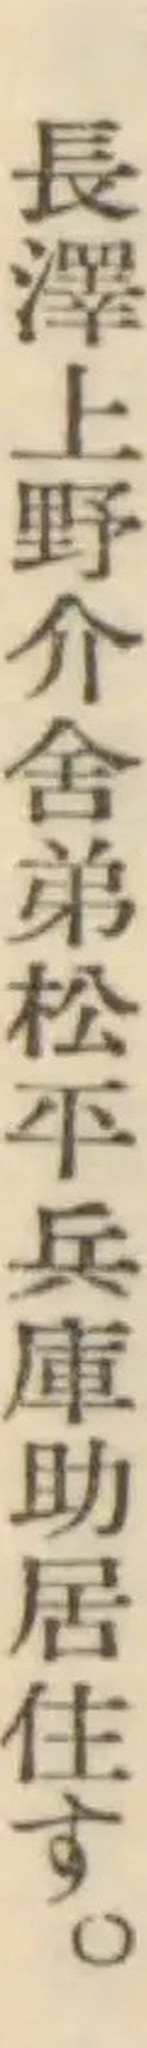長澤上野介舎弟松平兵庫助居住す。
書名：東三河之古城
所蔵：国立国会図書館 National Diet Library, JAPAN
